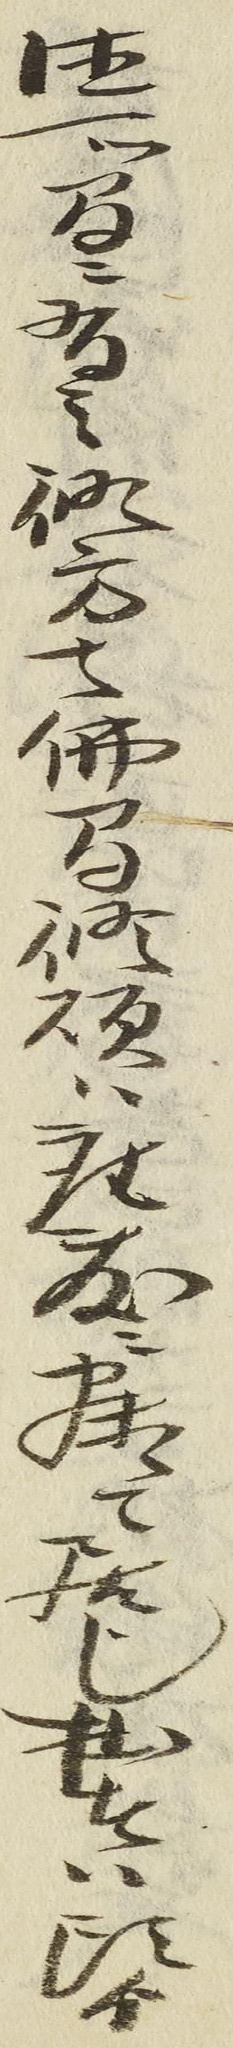徳一ツ間二有之修方は仏間修頭ハ座敷二寐候て居申候拙者ハ頭ゟ
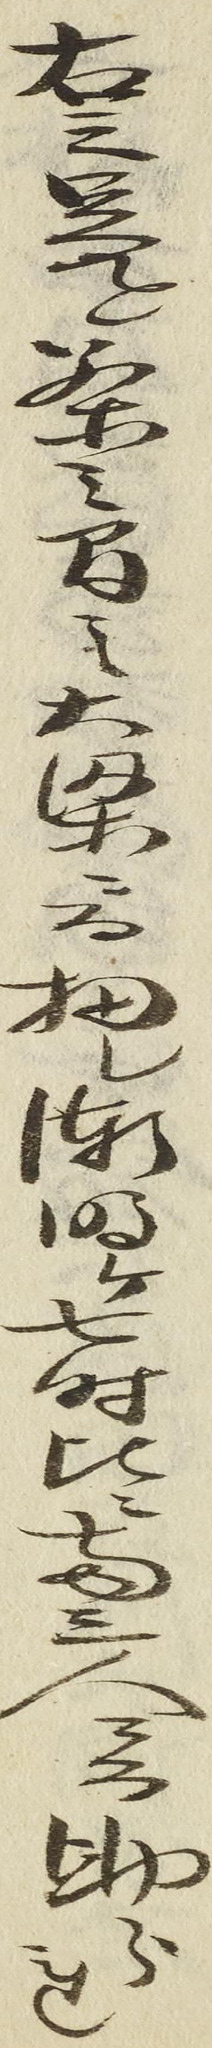右之足を茶之間之大梁二而押ㇾ漸明ヶ七時比二両三人二而助られ
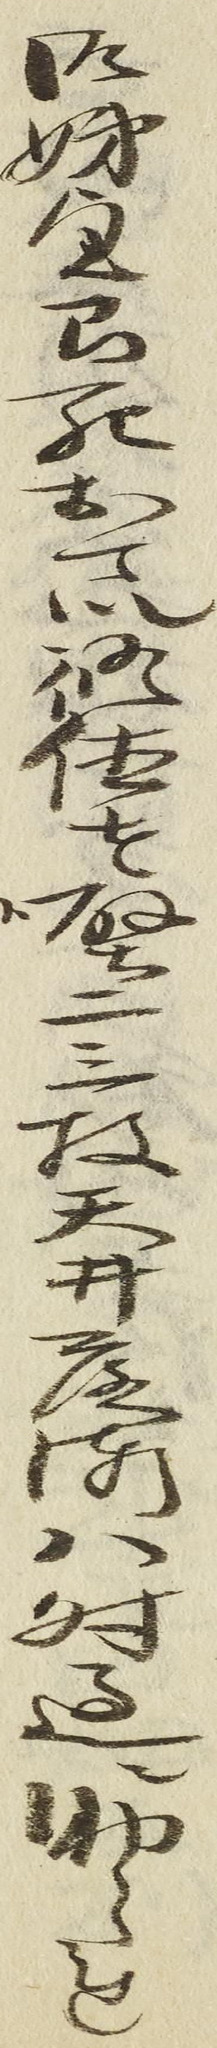御姉殿即死おてい修徳は壁二三枚天井落漸八時過二助られ
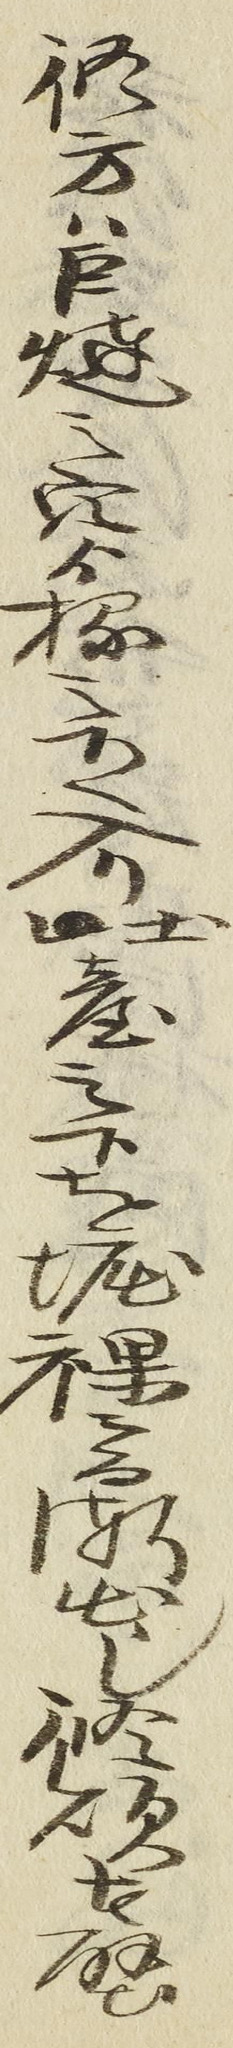修方ハ炬燵之穴ゟ掾之下へ入り土台之下を堀躶二而漸出申候修磧は壁
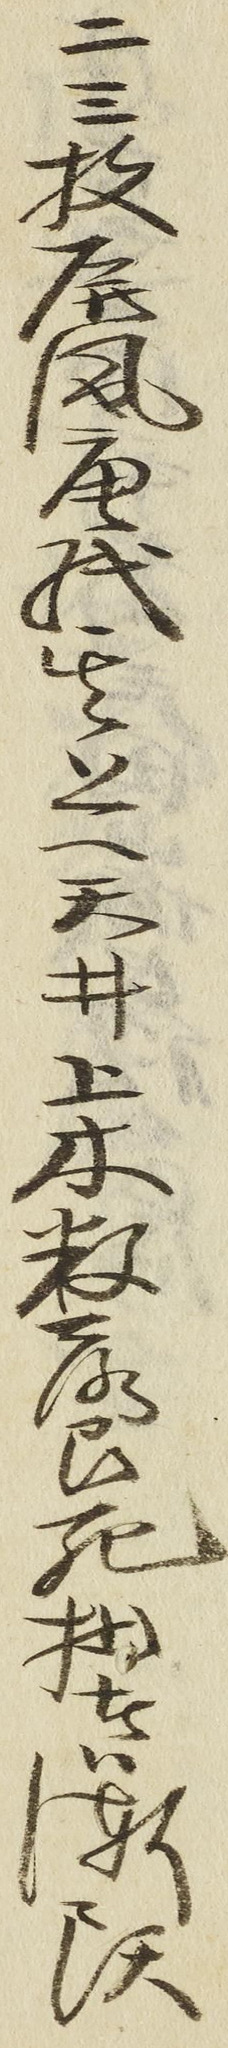二三枚屏風唐紙其上へ天井上木数落即死拙者は漸頭
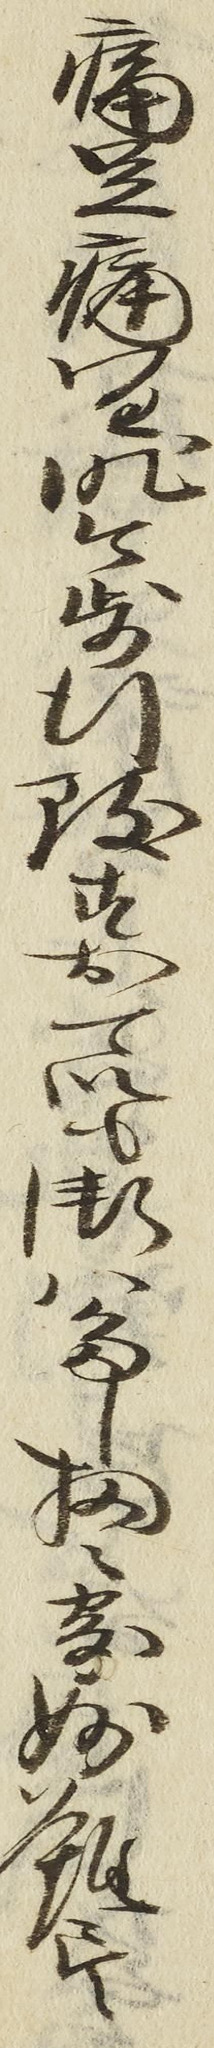痛足痛口昨今歩行致すおていも漸はたし扨々奇妙難尽
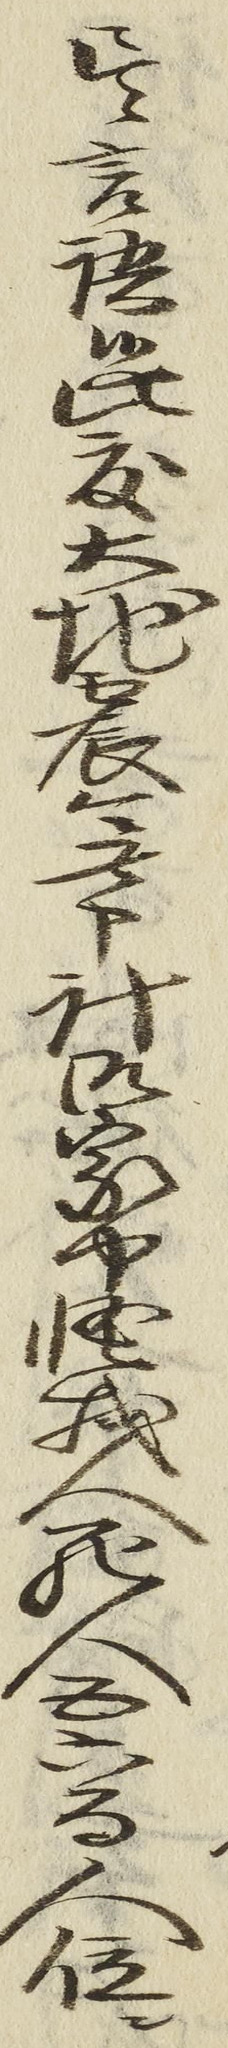尽言語候此度大地震無申計御家中怪人死人五六百人位二
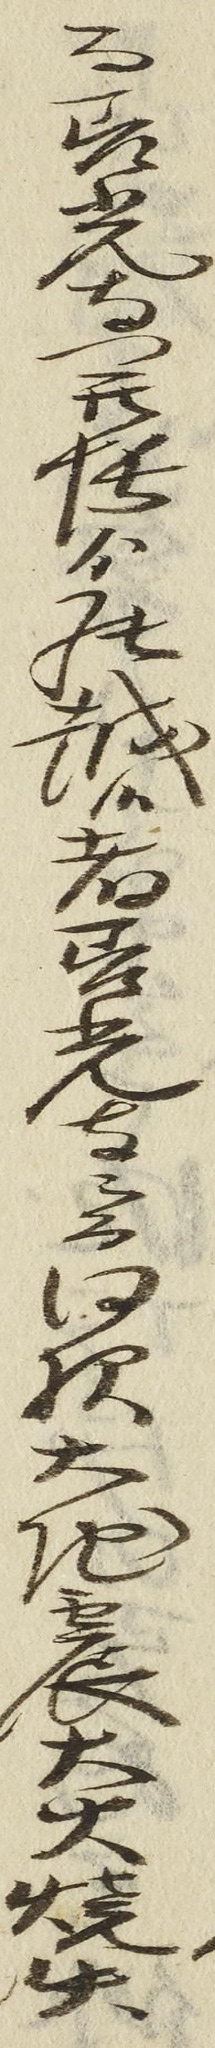而善光寺開帳ゟ罷越候者善光寺二而同夜大地震大火焼失
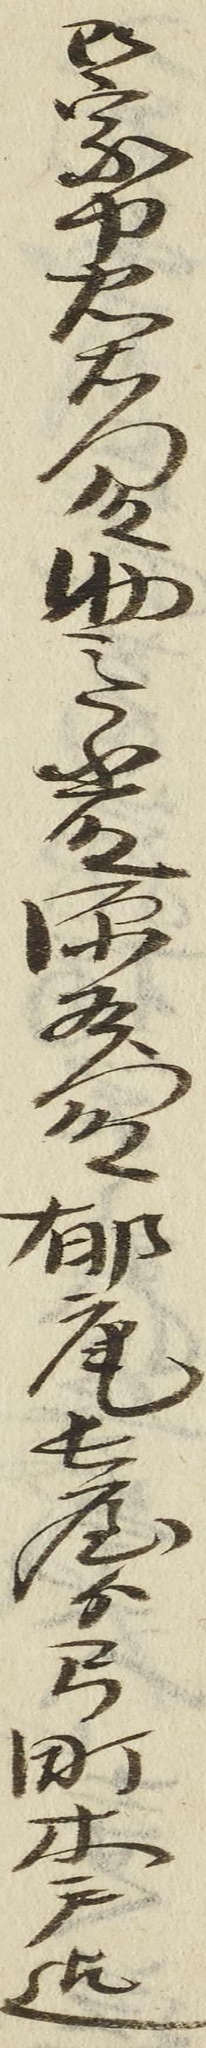御家中忠左衛門殿助之丞殿源左衛門殿郁庵長屋ゟ弓町木戸迄
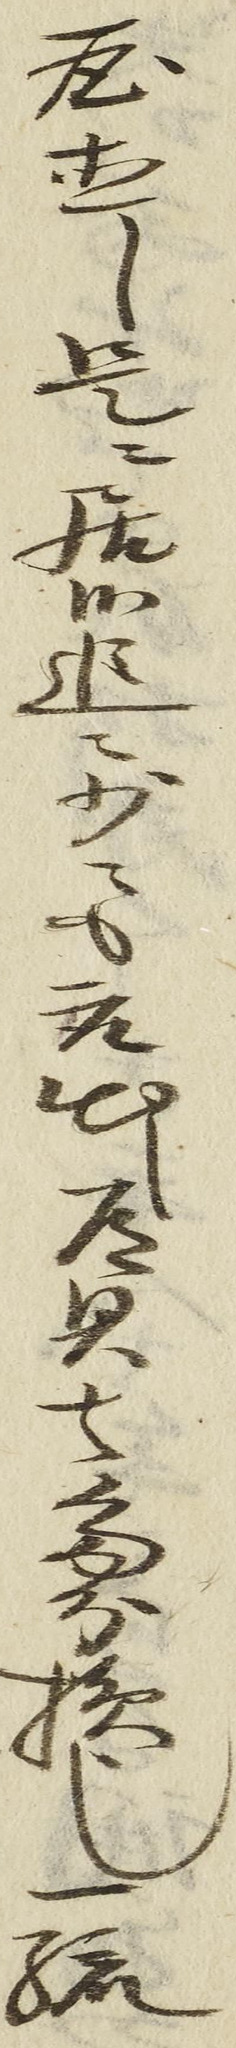屋直し是に居候追々少々も取出し道具は多分損申候一統
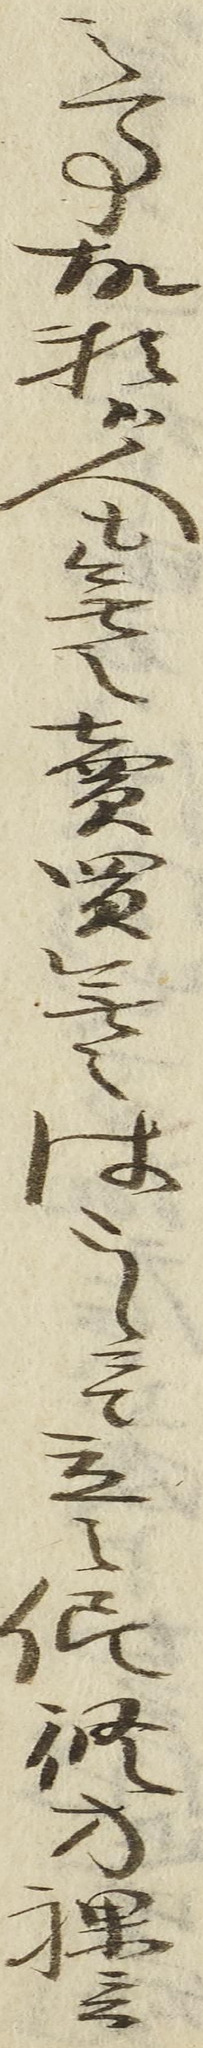之事故頼候人も無之売買無之はたし二て立之儘修方躶二而
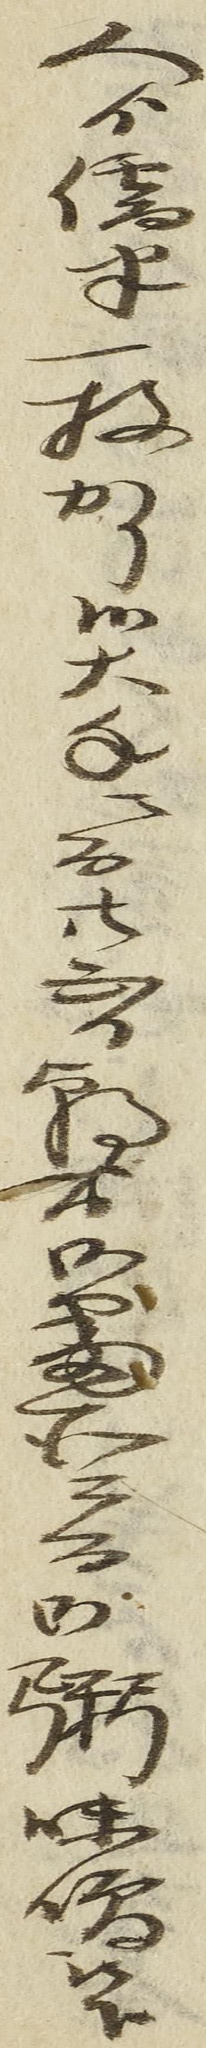人ゟ襦袢一枚かり候大手二而朝ゟ御番所二而御粥味噌被下

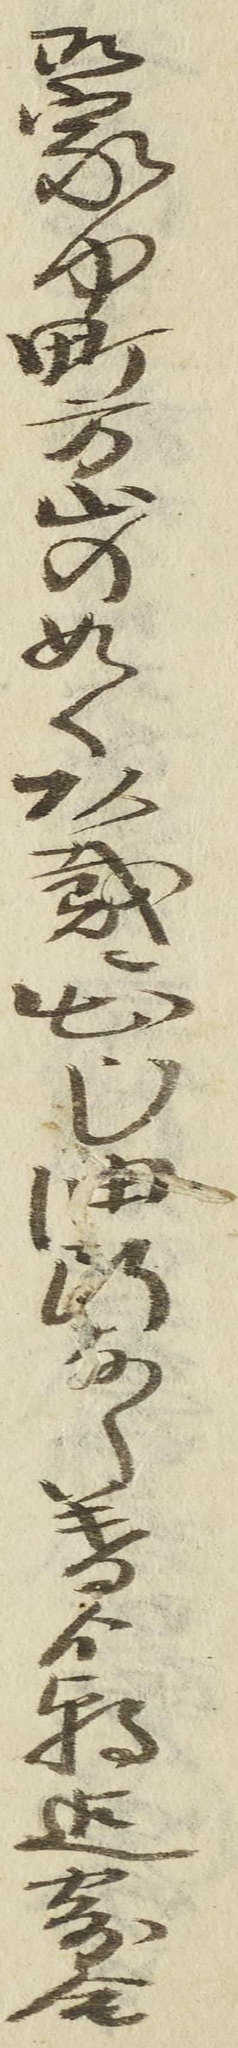御家中町方山の如く頂戴二出申候油断なく暮ゟ朝迄寄合
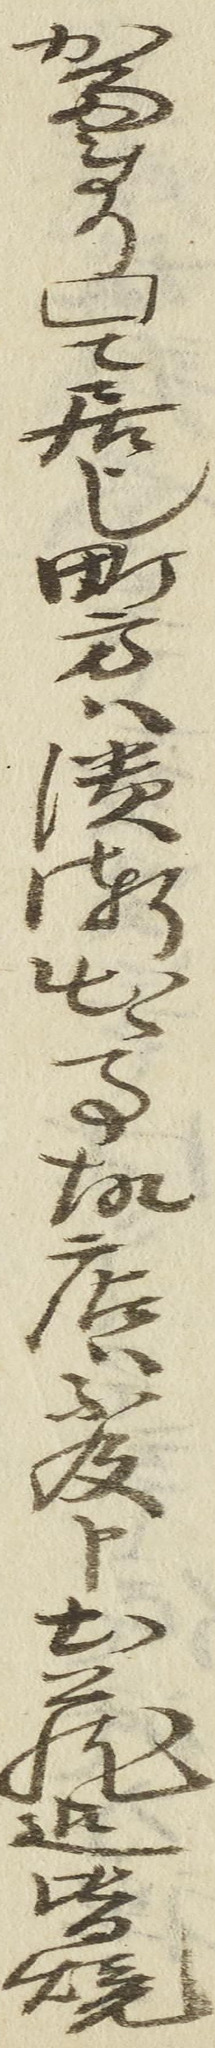かたまり口て居申候町方ハ潰漸出候事故店ハ不及申土蔵迄皆焼
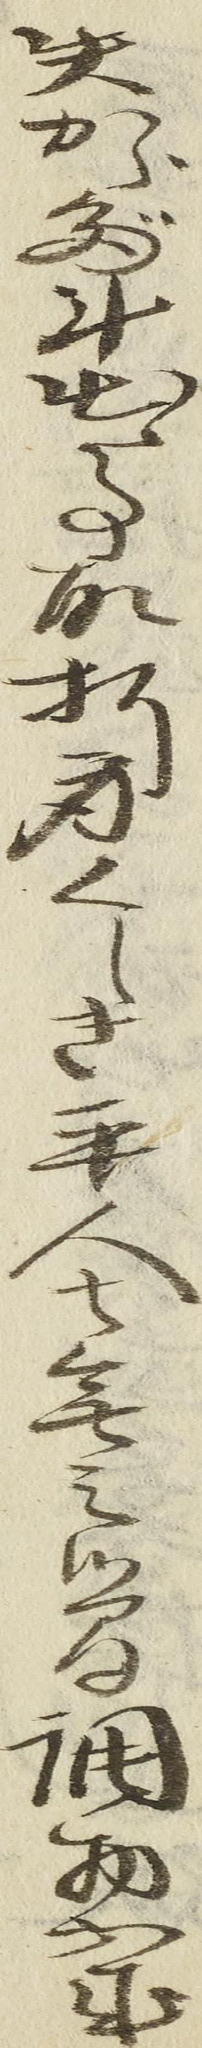失からだ斗出候事故打身くしき平人は無之候間調物等成
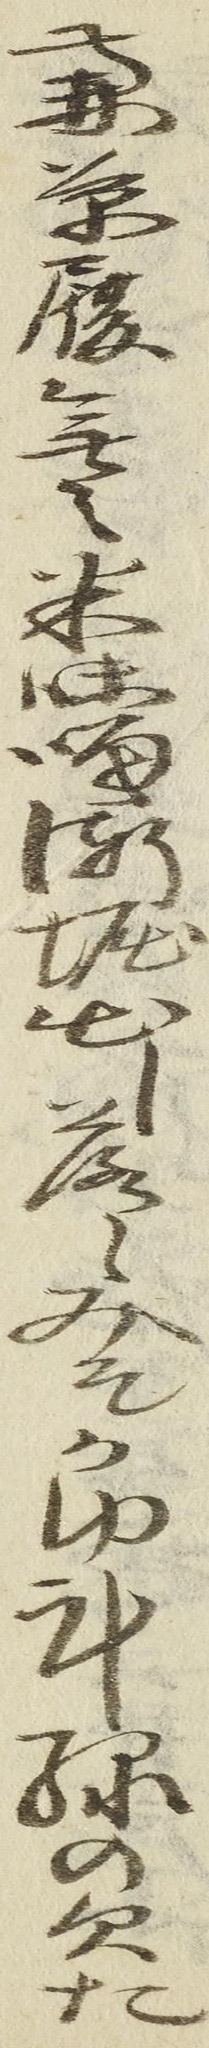兼草履無之米味噌漸堀出し落しみそかゆ斗縁の欠た
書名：信濃國大地震記　乾
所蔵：東京大学地震研究所図書室 Earthquake Research Institute Library, The University of Tokyo, JAPAN
